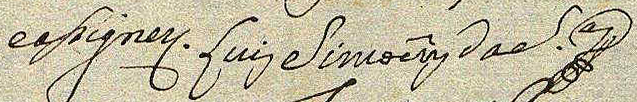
e assigney Luis Simoens da S.a
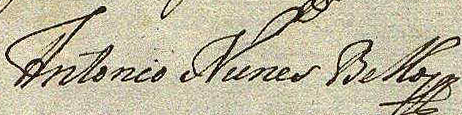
Antonio Nunes Bello
